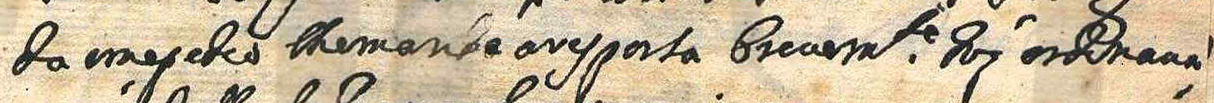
da e me pedeo lhe mande a resposta breuem.te do q̄ ordenaua
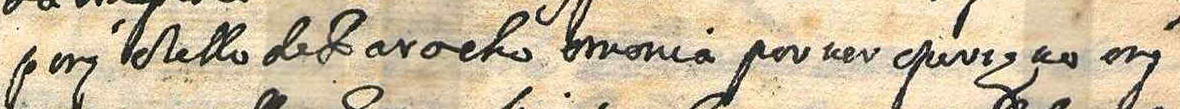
porq̄ o zello de Parocho o mouia por uer o perigo em q̄
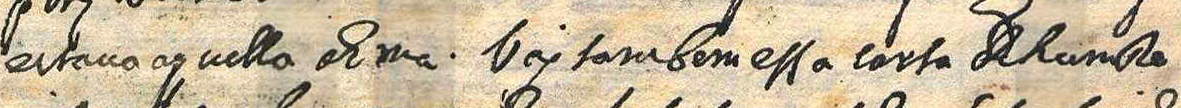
estaua aquella alma. Vaj tambem esta carta de hum Re
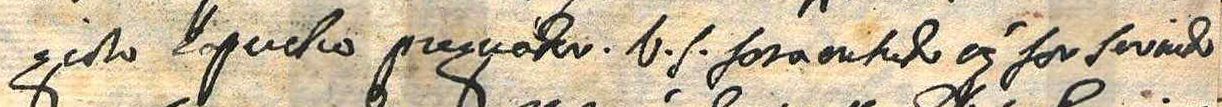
gisto daquello preguador. V. s. fosa en tudo o q̄ for seruido
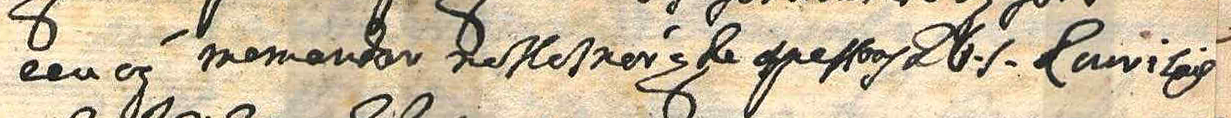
e eu o q̄ me mandar nosso snor̄ gde as pessoas d̄ V. S. Lourisais
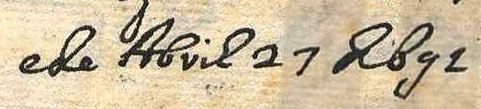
e de Abril 27 de 691
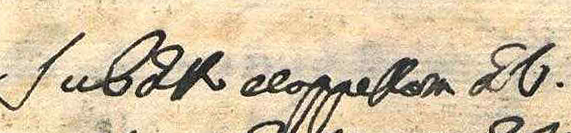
Subd̄tto e cappellam d̄ V.
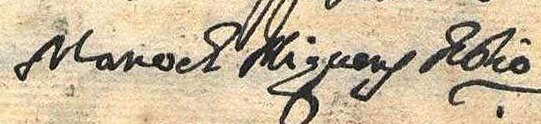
Manoel Miguens de Rio
